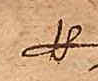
R
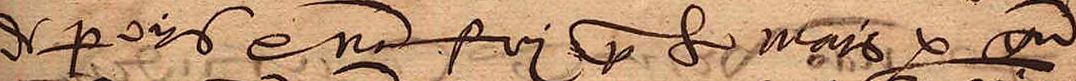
depoys e nā foy p̄ ho mais ꝑgū
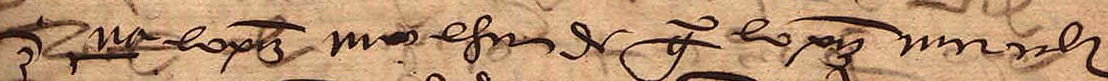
item cna lopīz molher de go lop̄iz mercador
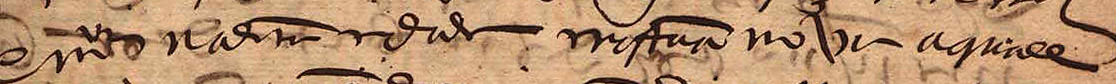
e mor na dita cidade cristāa nova a quall
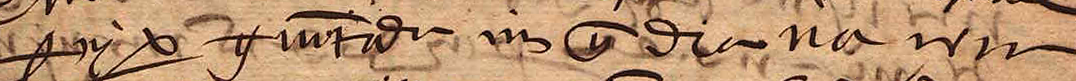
foy ꝑgūtada em q̄ dya naçera
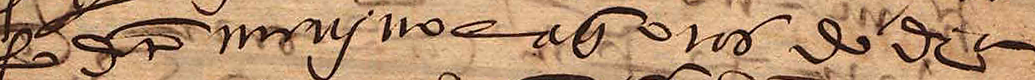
ho dito menjno e a q̄ oras do dya
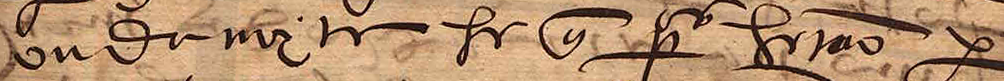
ou da noyte he q̄ pas herão ꝑ
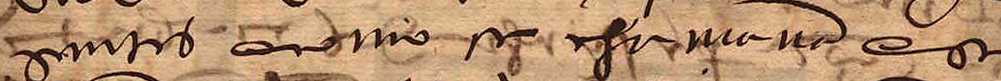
semtes e como se chamauā e se
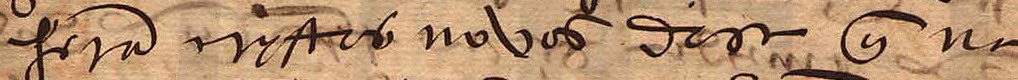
herā crystas novas dyse q̄ na
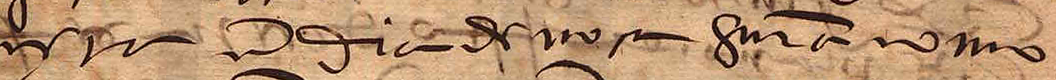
çera ē dia de nosa snr̄a como
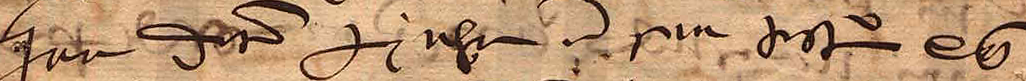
Jaa dito tynha ē seu testo e q̄
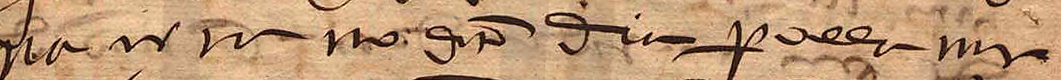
naçera no dito dia polla me
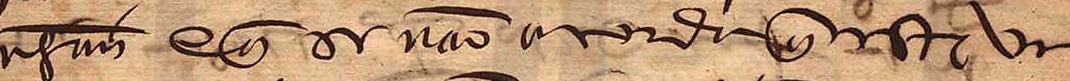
nhan e q̄ se não acorda q̄ estyve
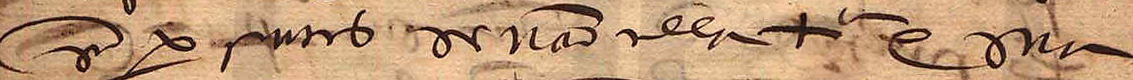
sē ꝑsentes senão ella ta e sua
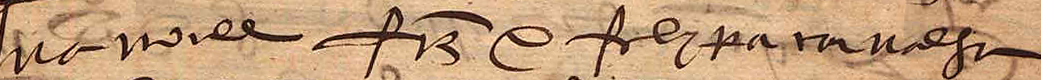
manoell fr̄z e felypa carualha
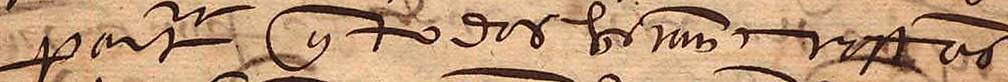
partra q̄ todas heram crystās
